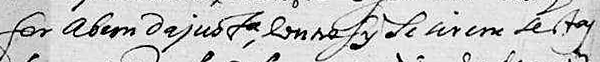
for a bem da justa, e outrosy se tirem tes.tas
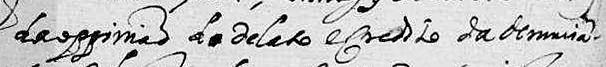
da oppiniaõ do delato e Credito da denuciā
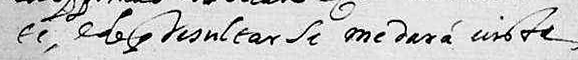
te, e do q̄ resultar se me dará uista
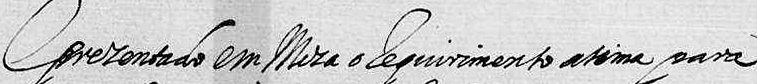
E prezentado em Meza o Requirimento asima para
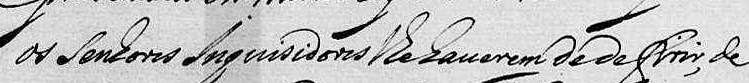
os Senhores Inquisidores lhe hauerem de defirir, de
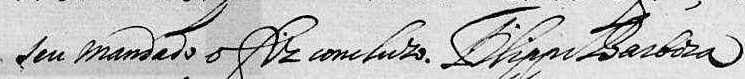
seu mandado o fiz concluzo. Filippe Barboza
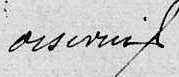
o escreuj
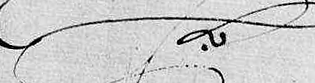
Cl.o
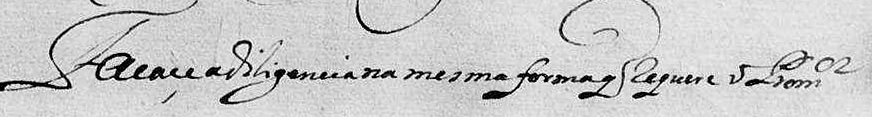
Facaçe a diligencia na mesma forma q̄ Requere o Prom.or
